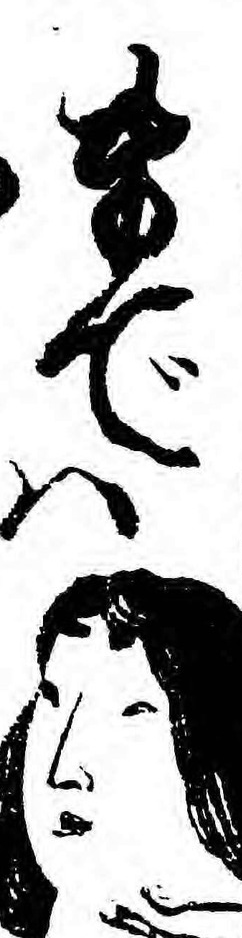までは
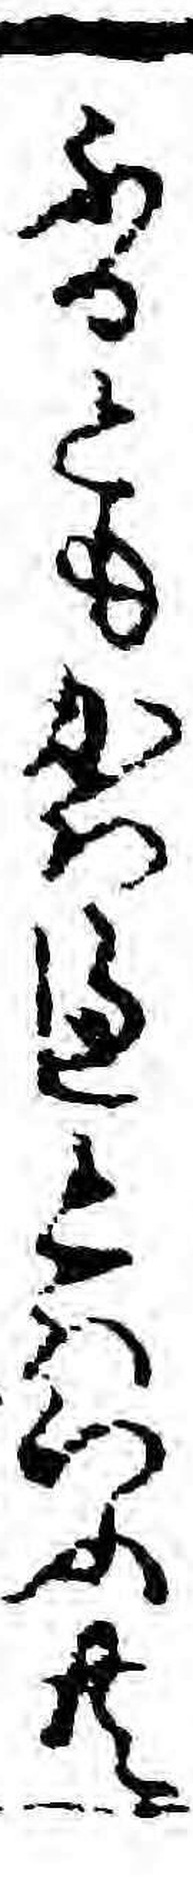ふるともかはらじとはいふ共
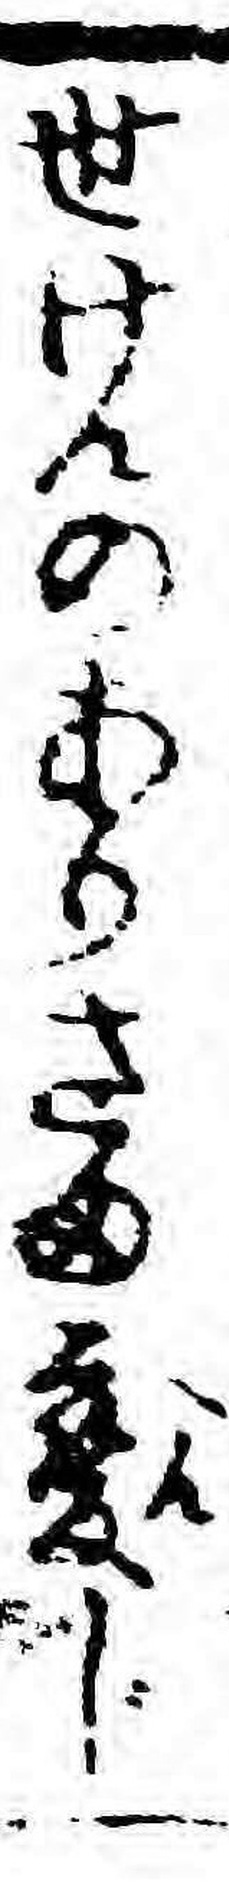世けんのありさま変じ
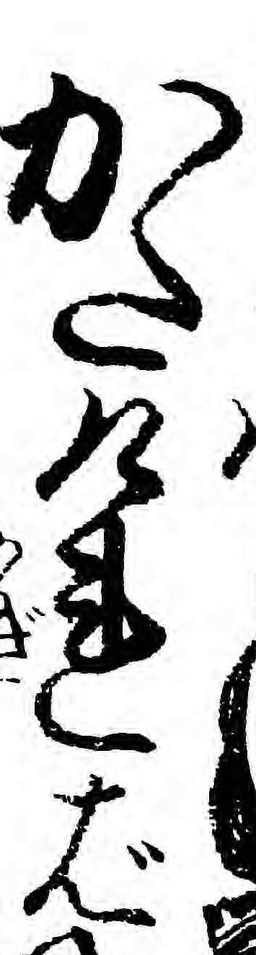かたければ
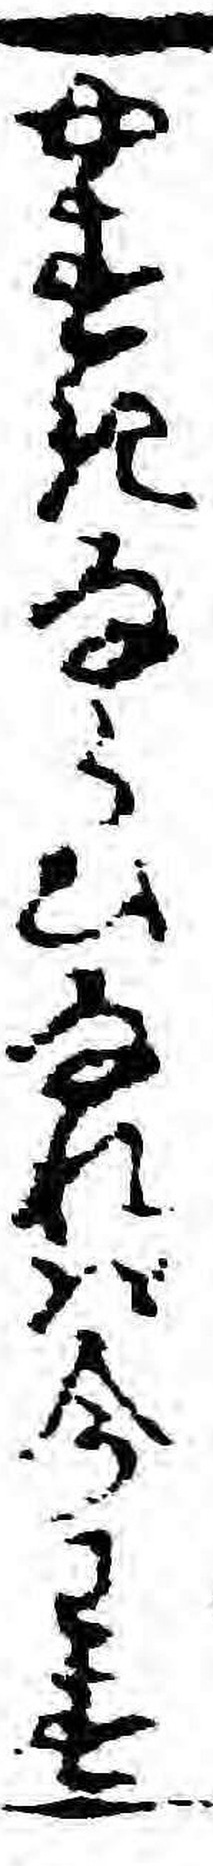やすきならひなれば今わす
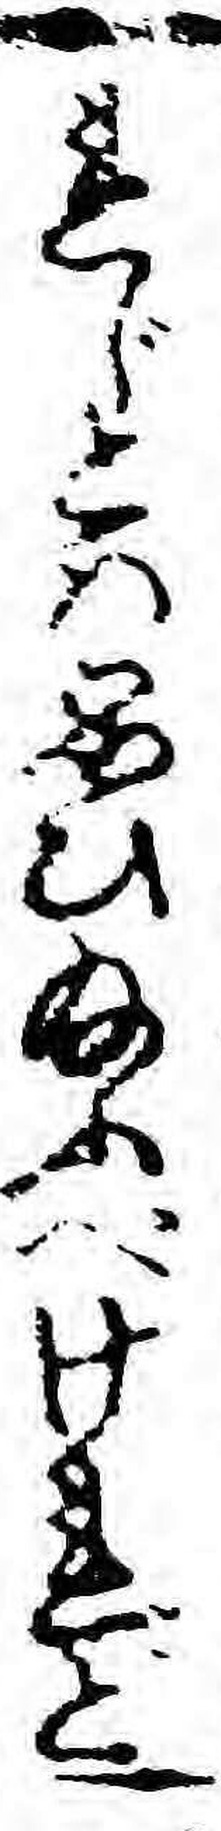れじとは思ひ給ふべけれと
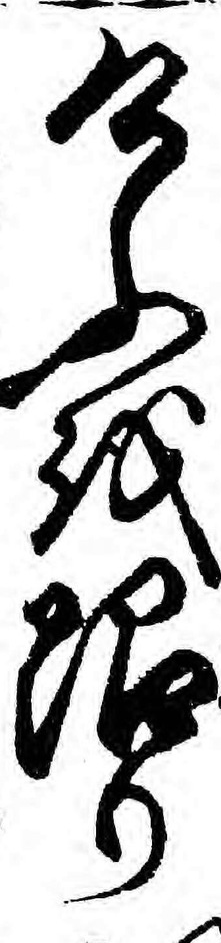けふを限り
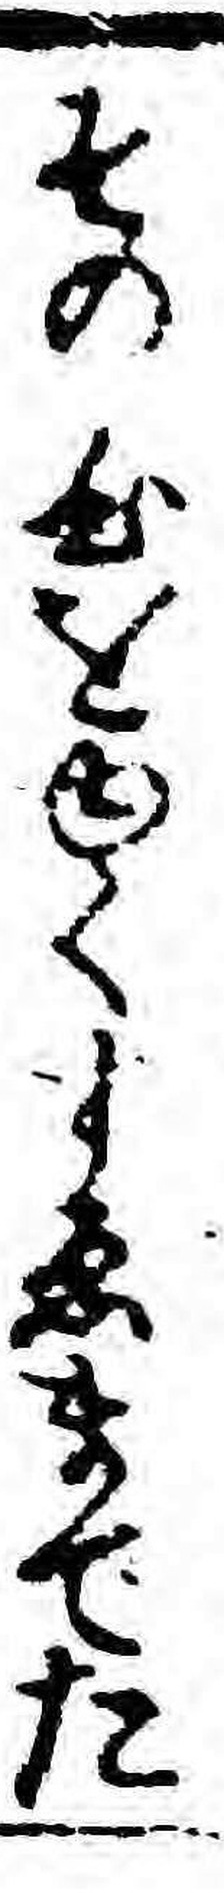その心をゆくすゑまでた
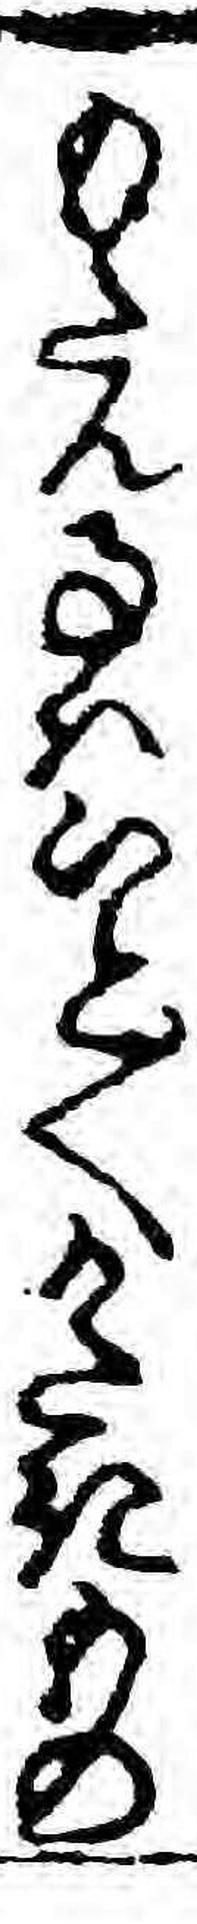もたん事はいと〳〵かたきもの
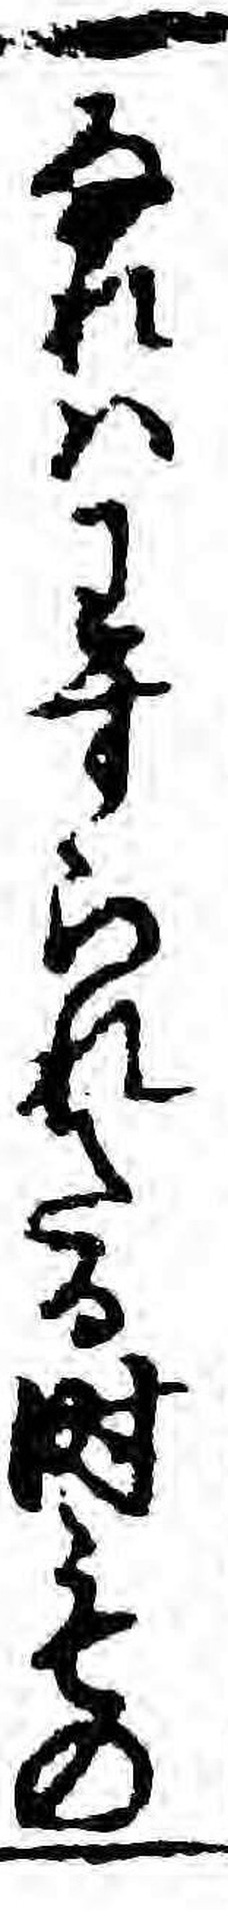なれはわすられたる時々その
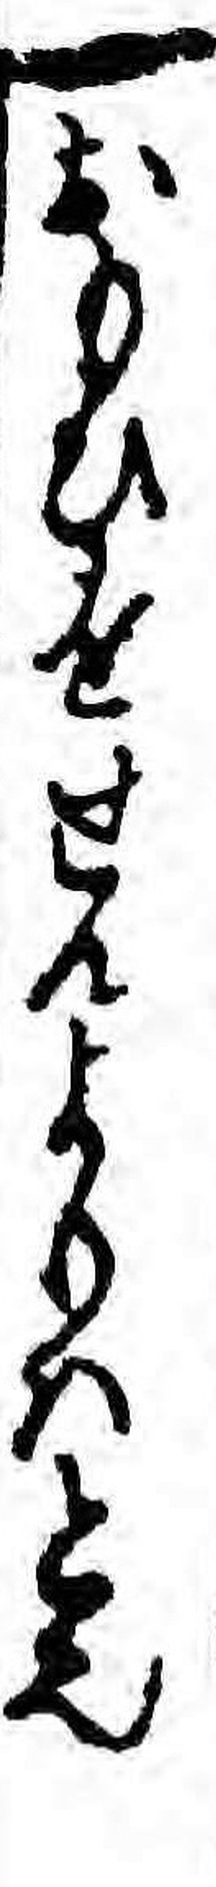おもひをせんよりはと也
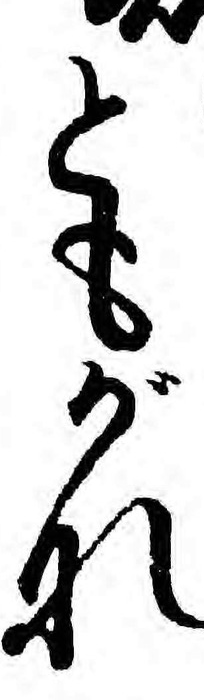ともがな
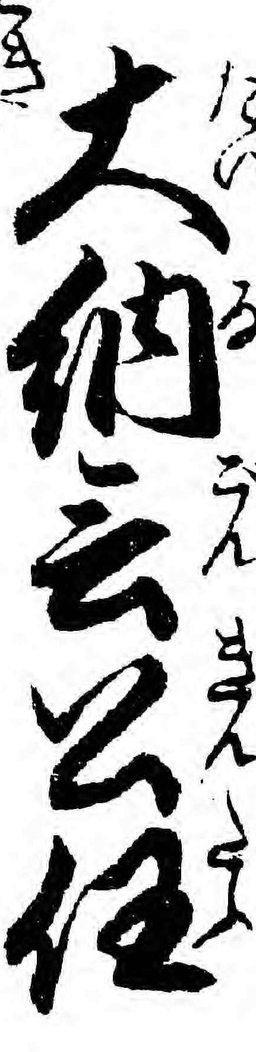大納言公任
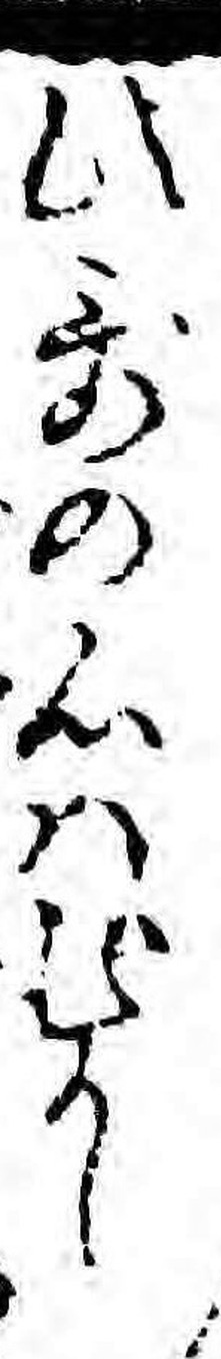此哥の心はむかし
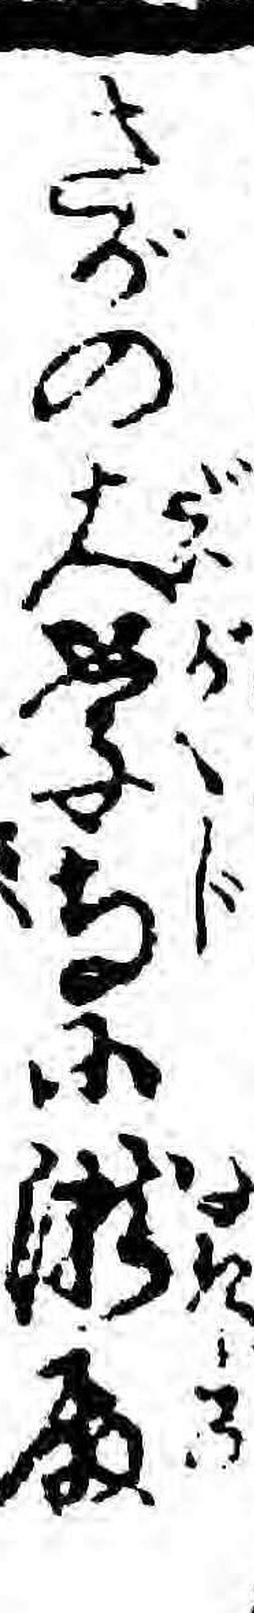さがの大学寺に瀧殿
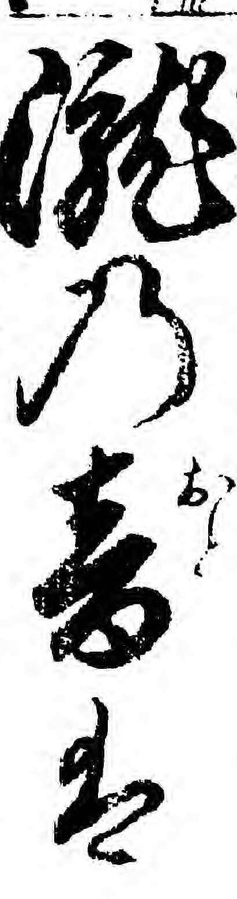瀧の音は
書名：頭書和歌注譯／壽賀多百人一首小倉錦
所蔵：国文学研究資料館
